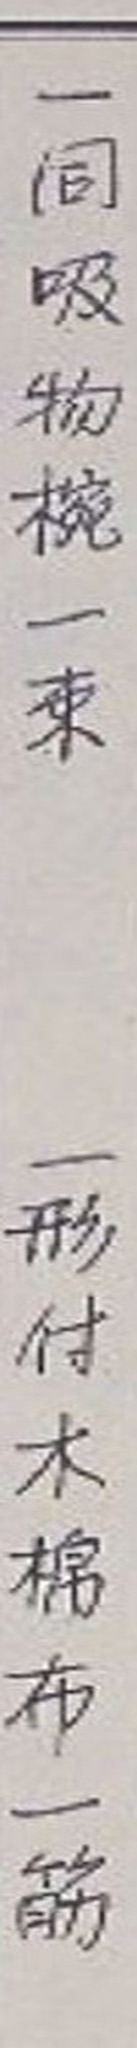一同吸物椀一束一形付木棉布一筋
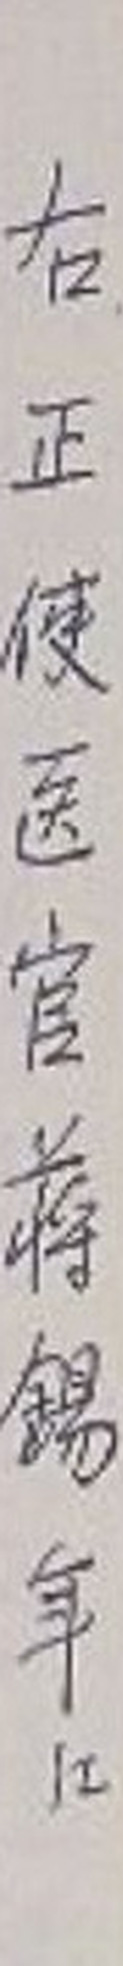右正使医官䉃錫年え
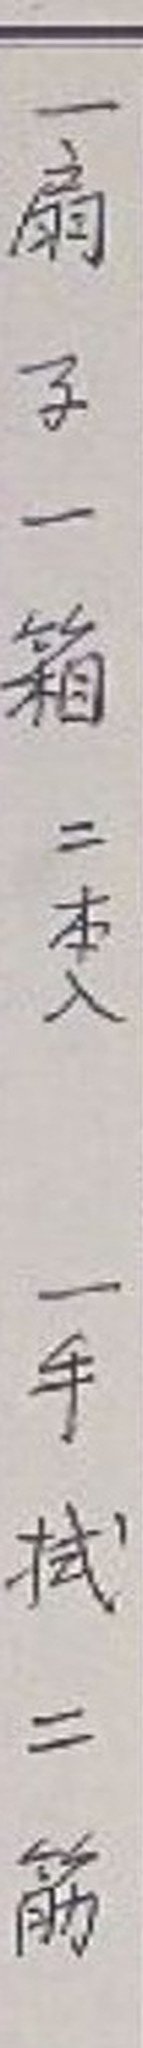一扇子一箱二本入一手拭二筋
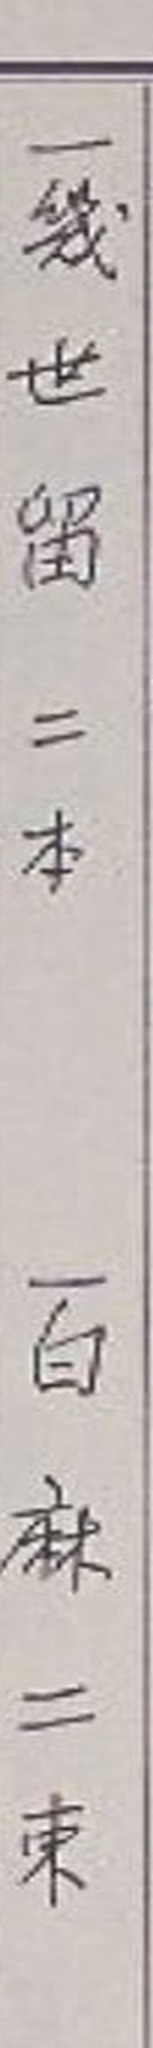一幾世留二本一白麻二束
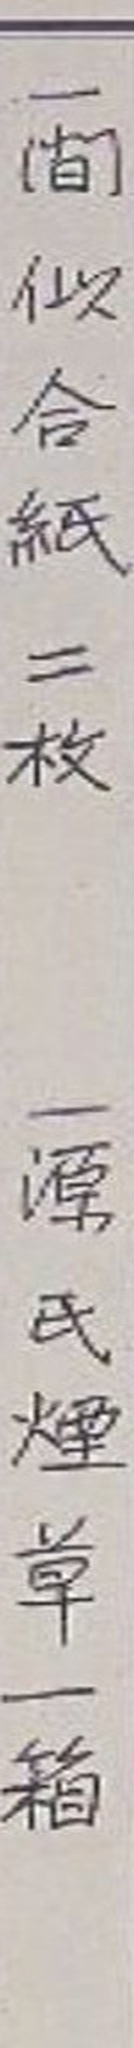一間似合紙二枚一源氏煙草一箱
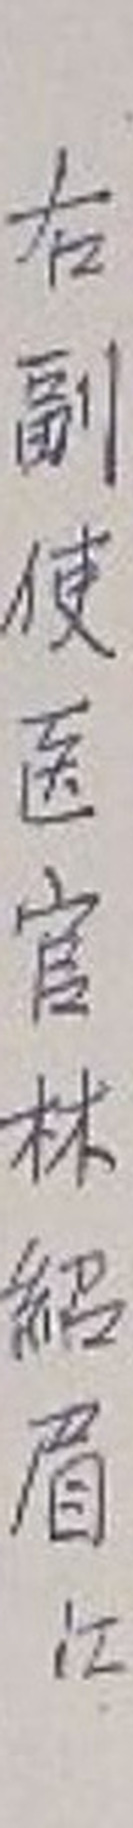右副使医官林紹眉え
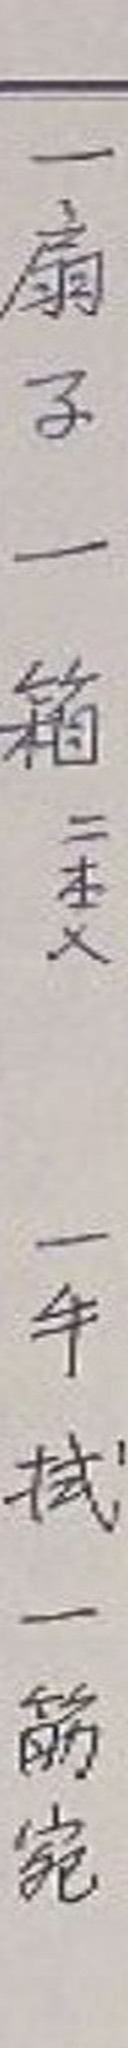一扇子一箱二本入一手拭一筋宛
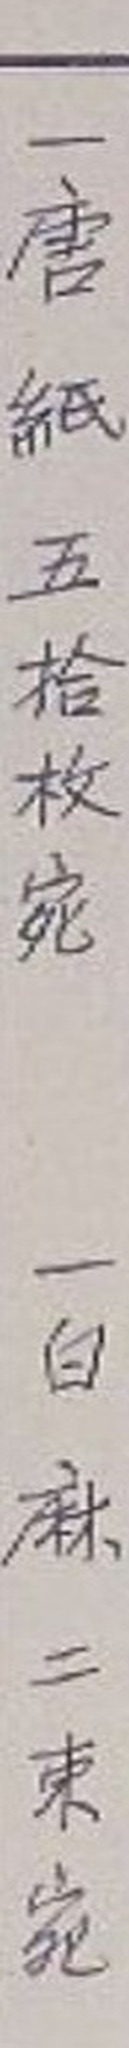一唐紙五拾枚宛一白麻二束宛

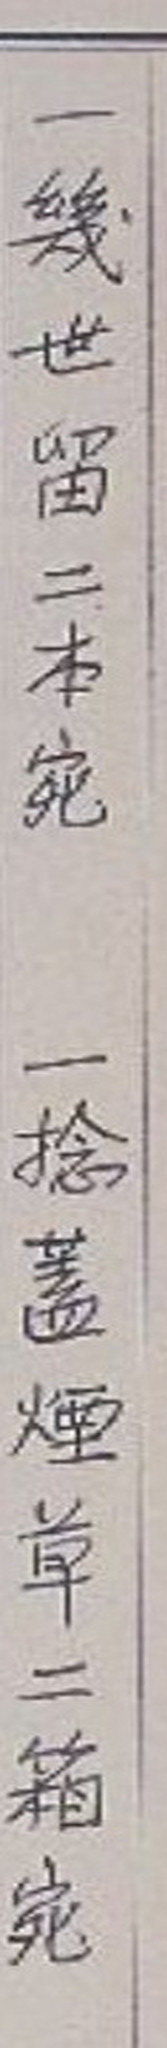一幾世留二本宛一捻蓋煙草二箱宛
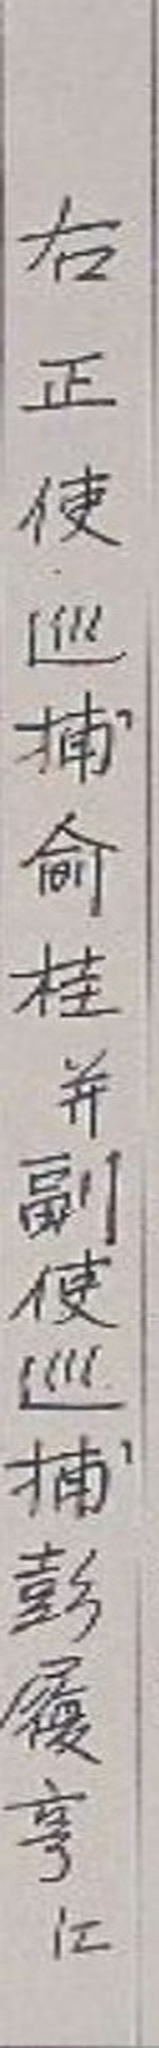右正使巡捕兪桂并副使巡捕彭履亨え
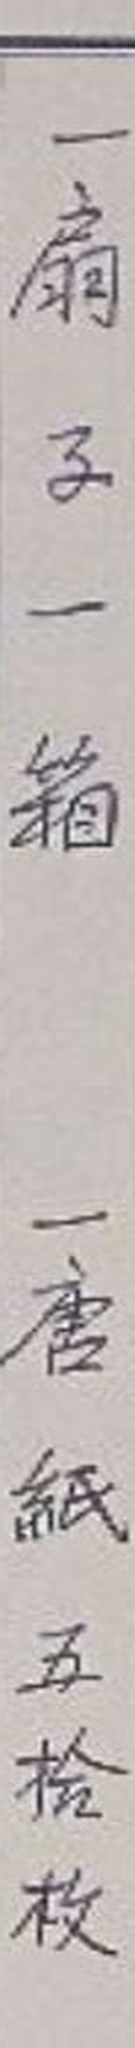一扇子一箱一唐紙五拾枚
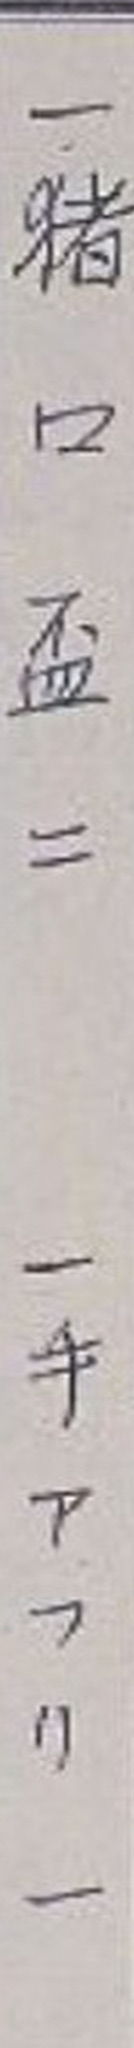一猪口盃二一手あふり一
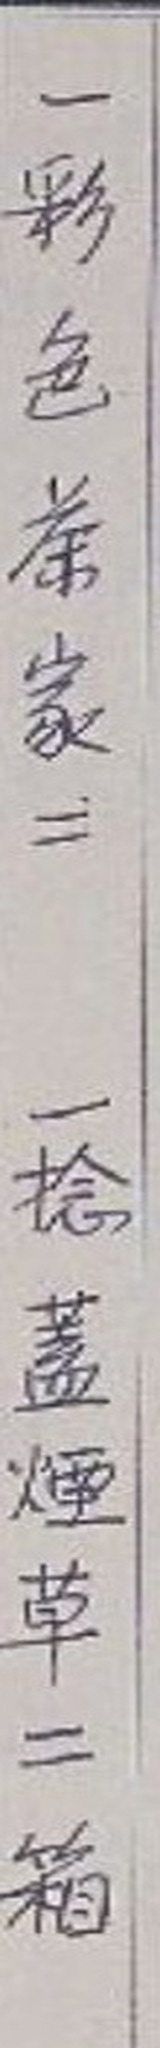一彩色茶家二一捻蓋煙草二箱
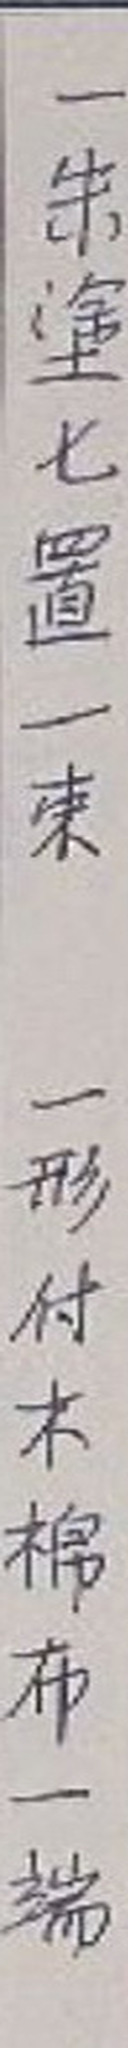一朱塗匕置一束一形付木棉布一端
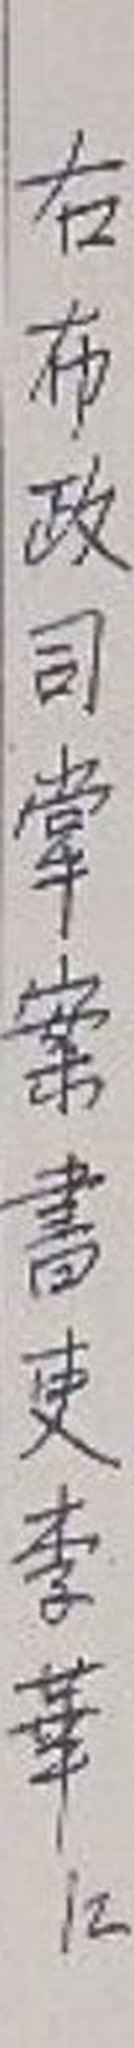右布政司掌案書吏李華え
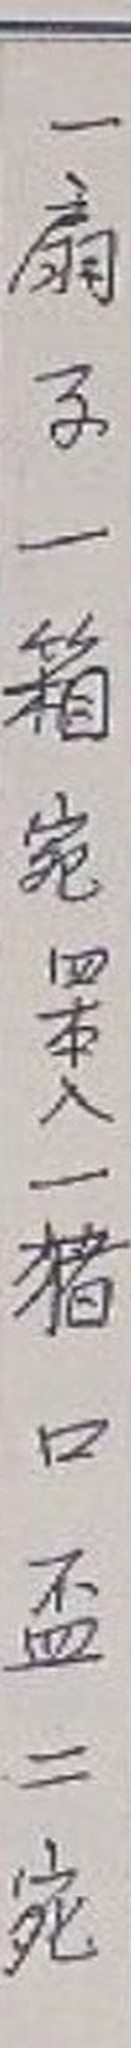一扇子一箱宛四本入一猪口盃二宛
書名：支那冊封使来琉諸記 下巻
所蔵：University of the Ryukyus Library
